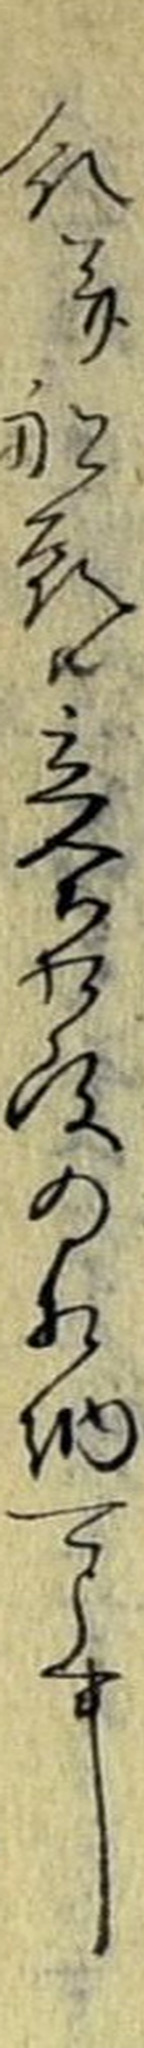領并船頭共立合相改可相納可申事
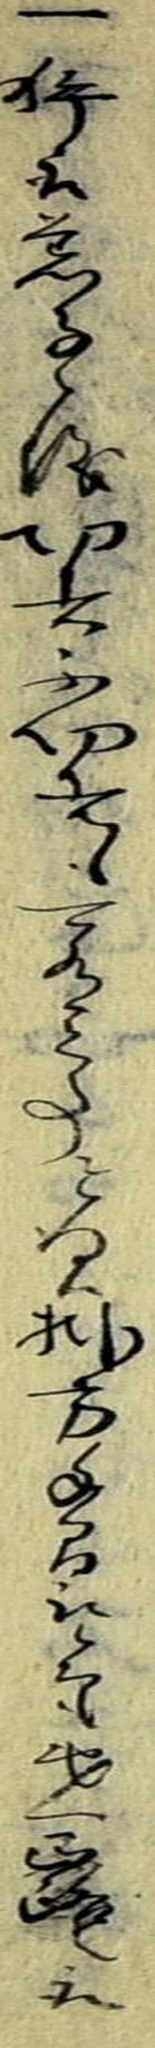一杵取荒子之儀切者不切者も可有之事に候得は掛方手間取候而も第一正路之取
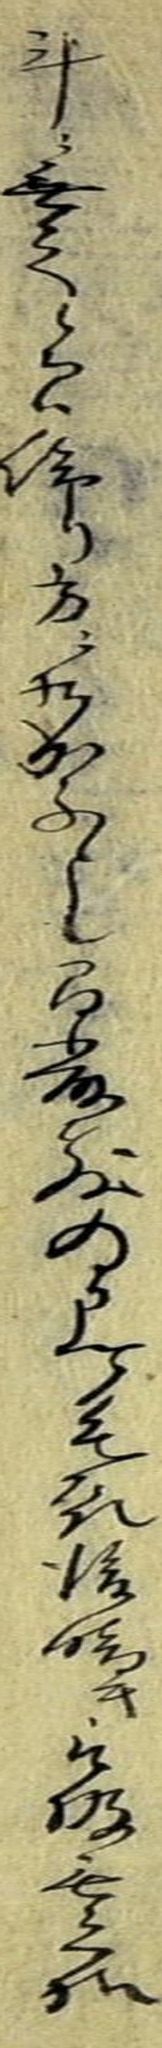斗に無之候而は締り方に相成不申候間厳敷可申聞毛頭後鳴キ取扱無之様
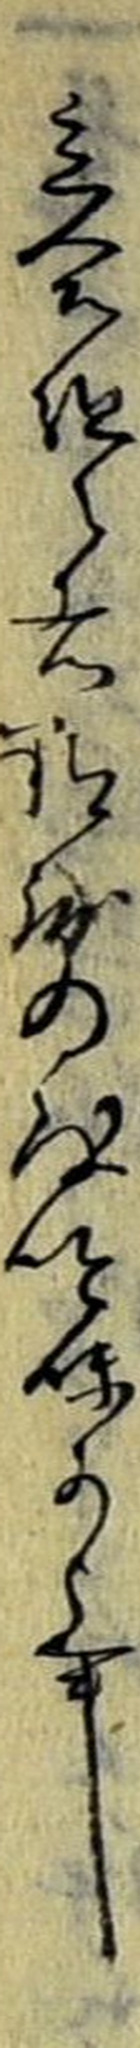立合組之者精誠可致吟味可申事

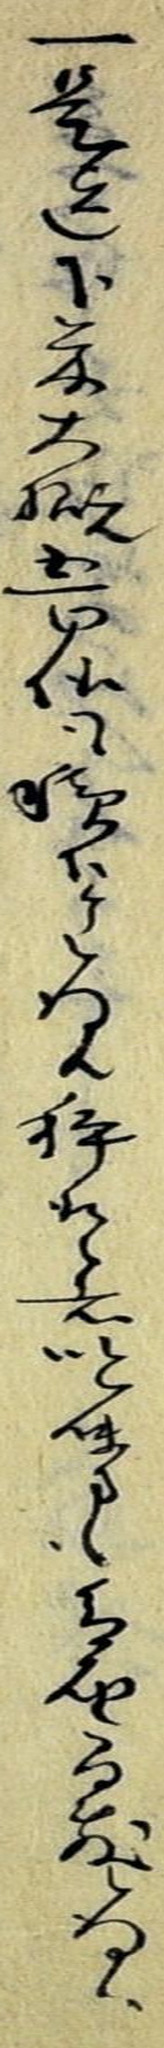一是迄下米大概五百俵つヽ積下ヶ候得共杵取之者吟味方も馬届間敷候得は
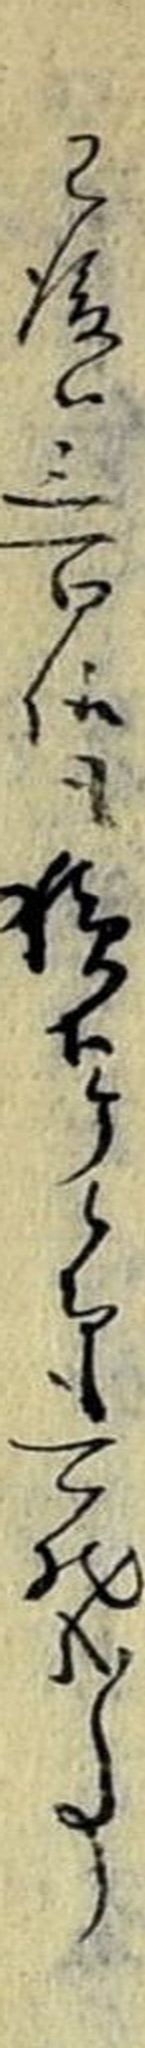已後は三百俵も積下ヶ候而も可然哉事
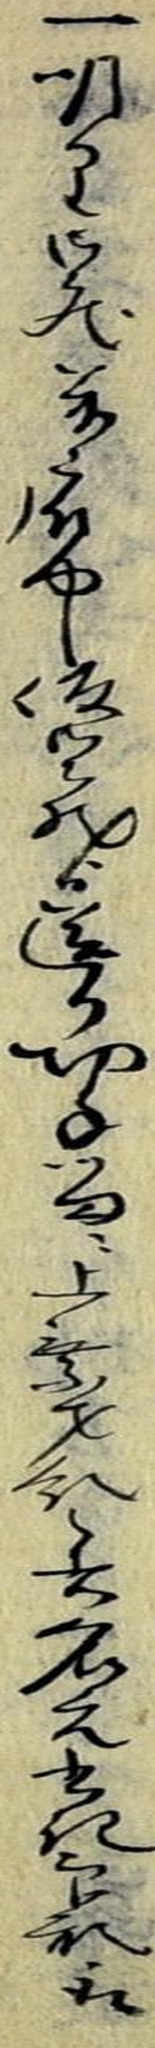一明里御蔵并府中仮御蔵ゟ送り切手留に上乗才領之者名元書記印形取
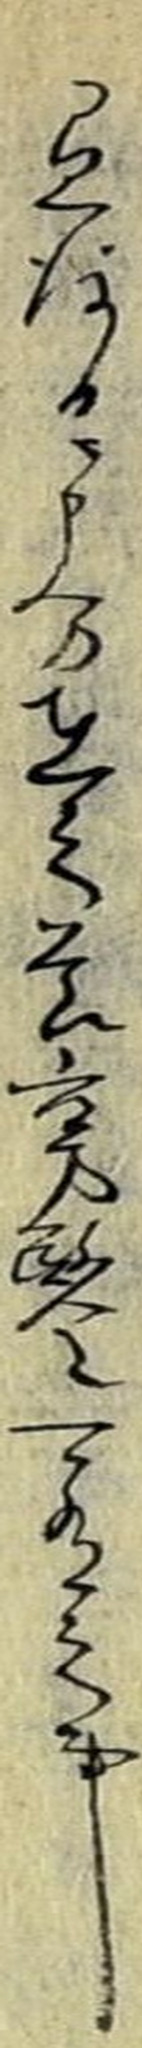置後日に申分在之節穿鑿可有之事
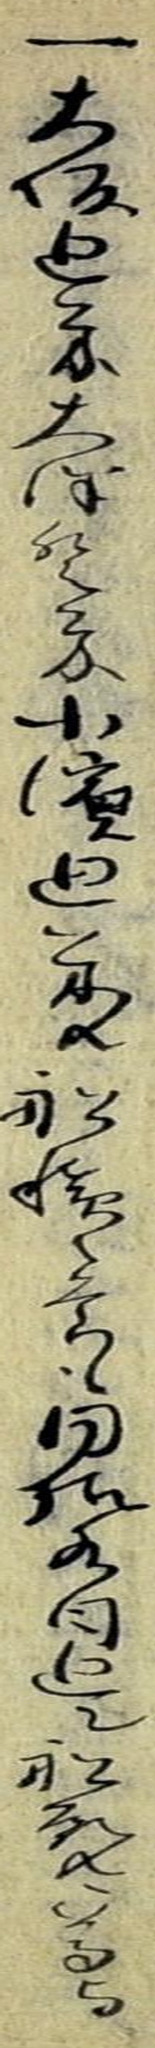一大坂廻米大津発米小浜廻米共船積之節も同様水目廻し船頭共へ篤と
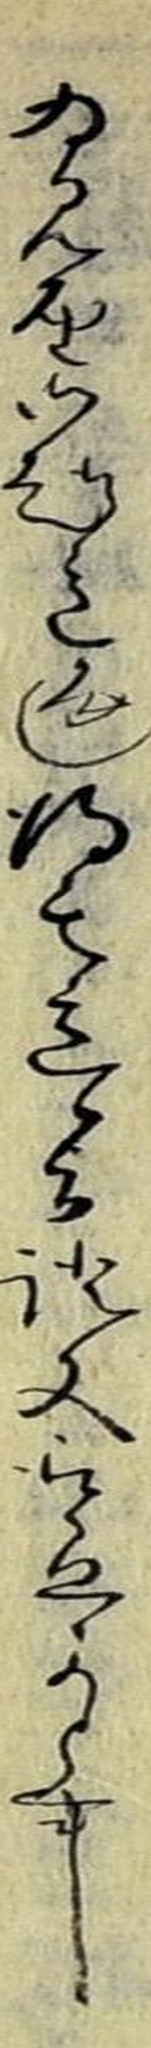為見届御趣意通得其意候旨証文取置可申事
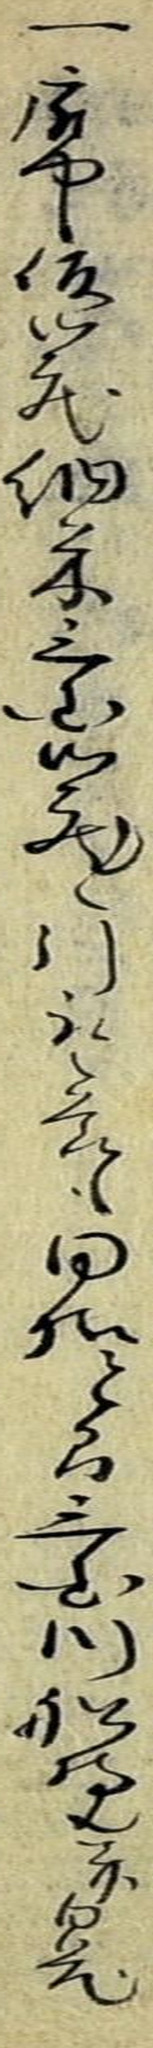一府中仮御蔵納米三国御蔵へ引取之節も同様に候間三国川船持共并白鬼
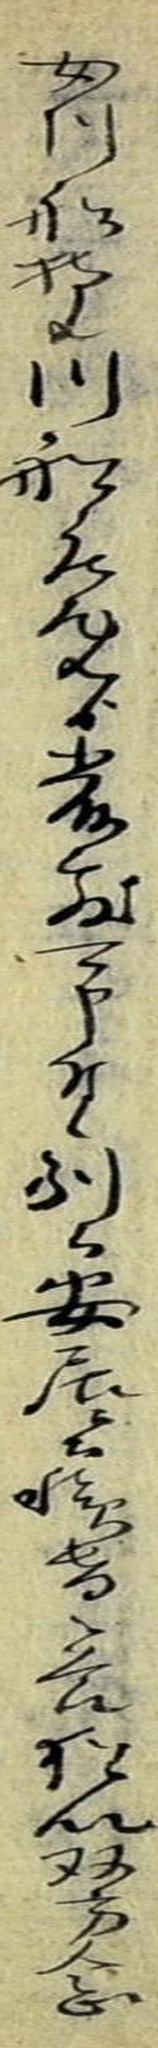女川船持共川船庄屋共ゟ厳敷可申付候別而安居に而積替候節猶以双方念
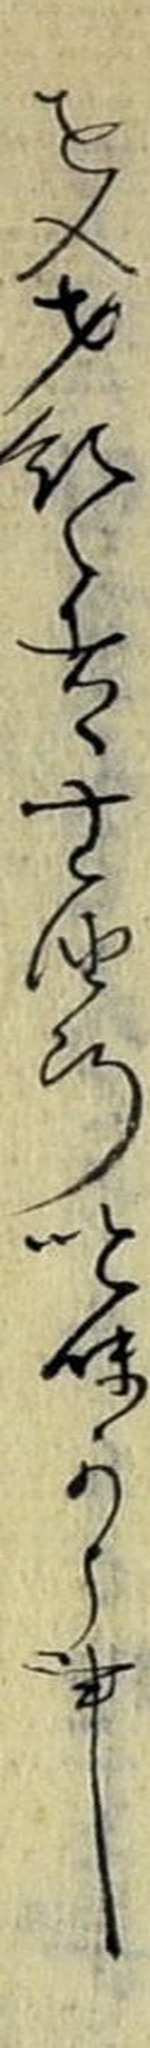を入才領之者へ無由断吟味可申事
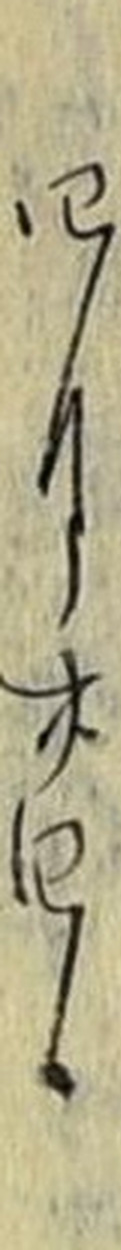四月廿四日
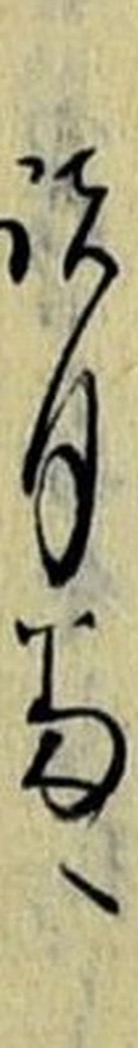諸月番へ
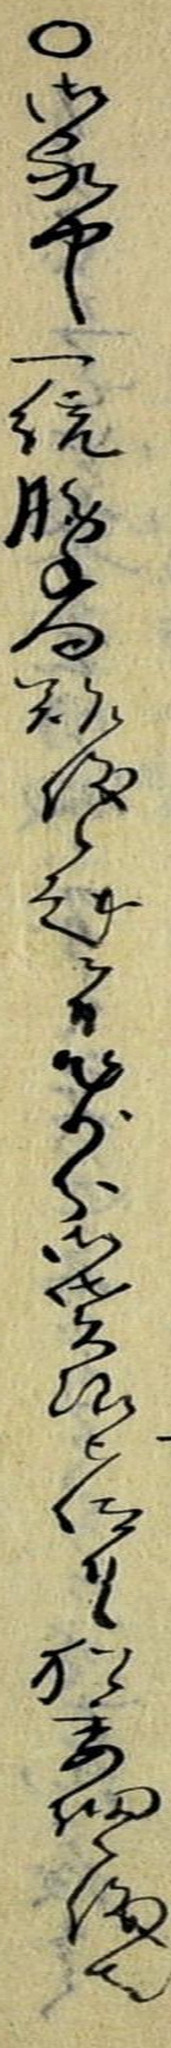○御家中一統勝手向難儀候趣に付乍少分御貸銀被仰付候猶委細之儀は
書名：命令之部 四
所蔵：福井県文書館 Fukui Prefectural Archives
